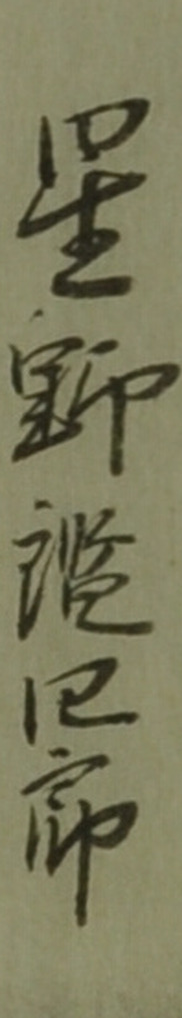星野鑑四郎
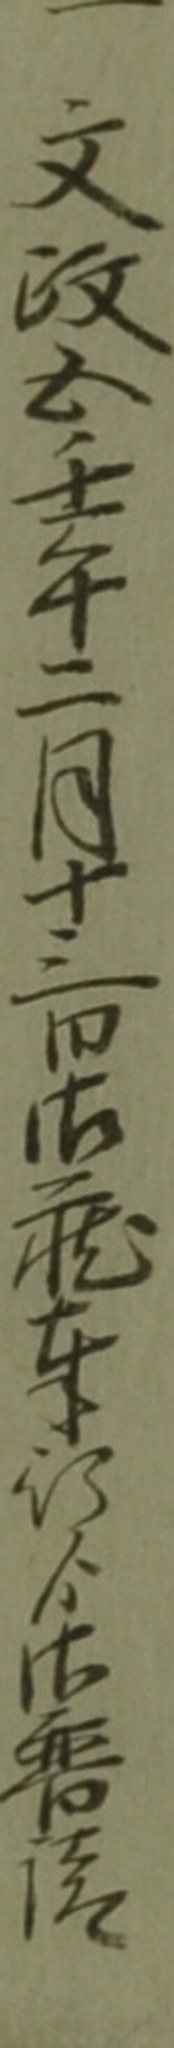一文政五壬午二月十三日御蔵奉行ゟ御普請
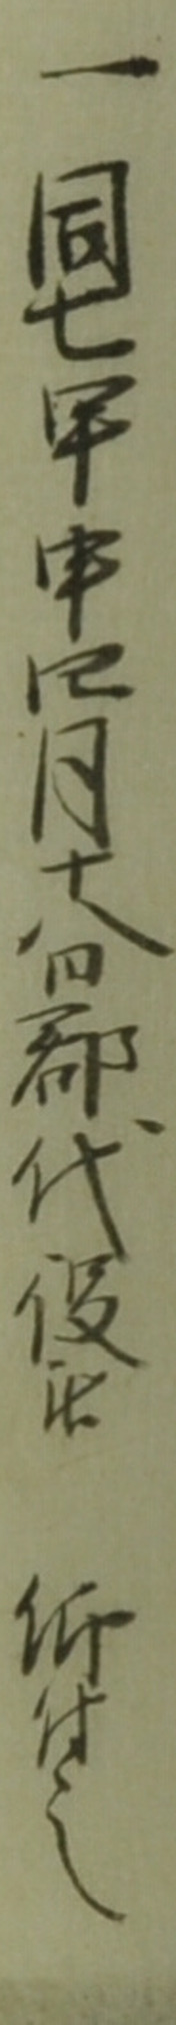一同七甲申四月十八日郡代役被仰付之
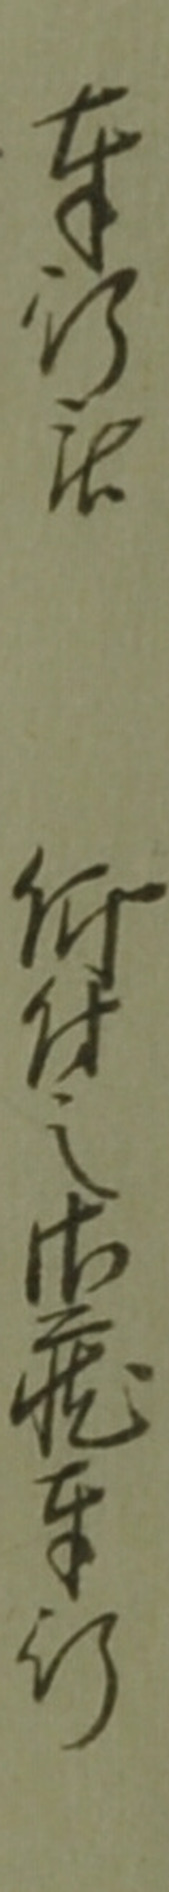奉行被仰付之御蔵奉行

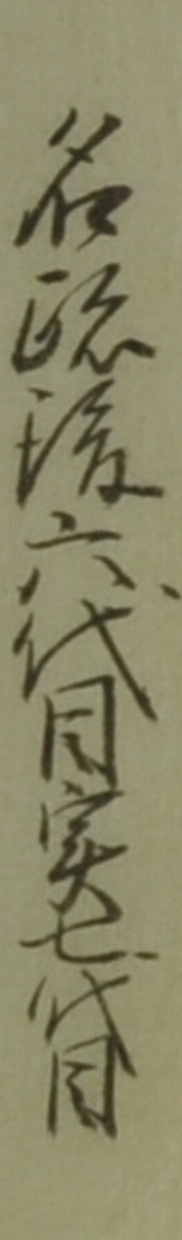名跡後六代目実七代目
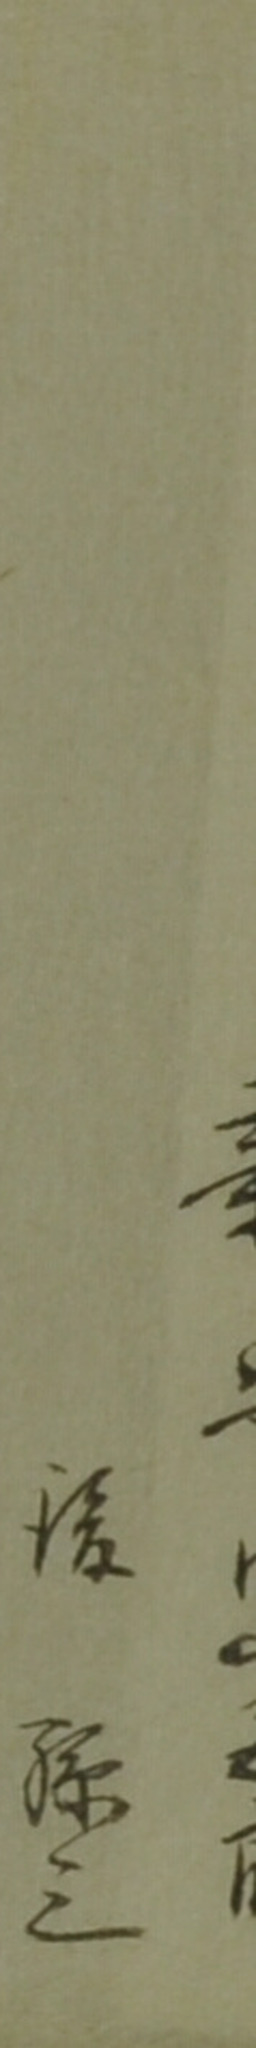後孫三
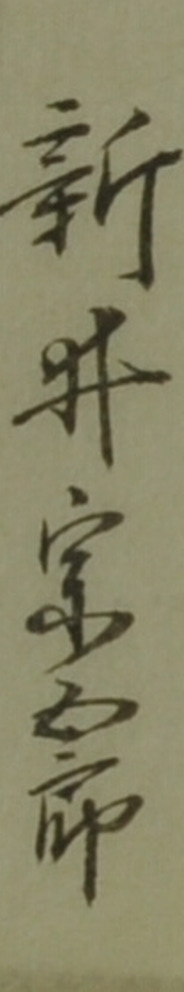新井宗五郎
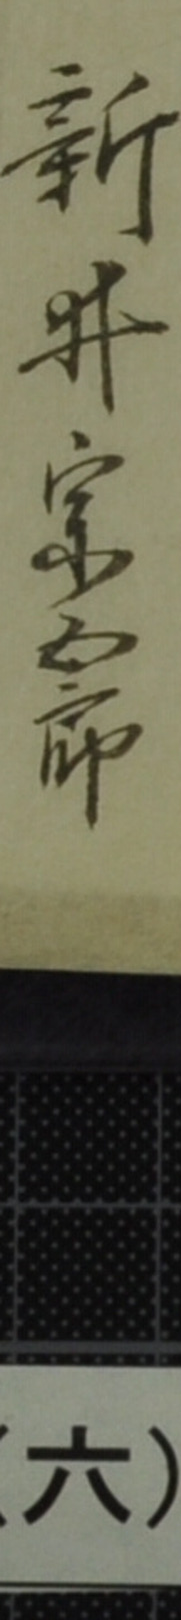新井宗五郎
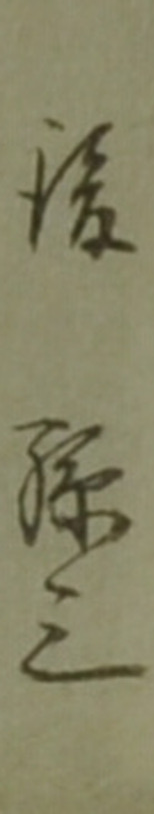後孫三
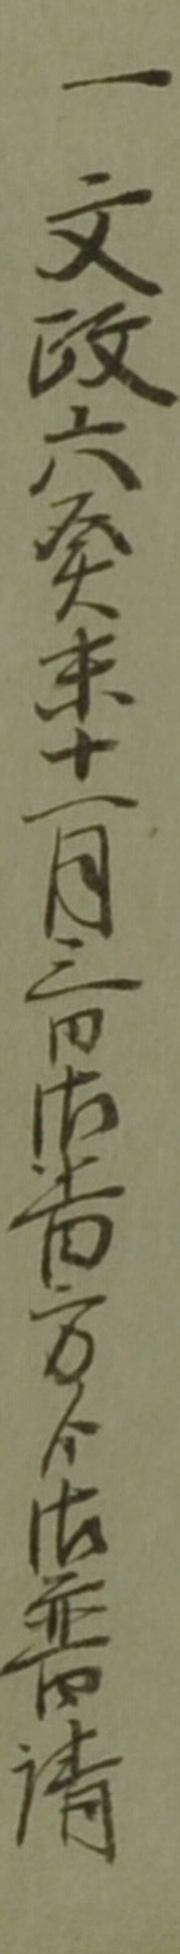一文政六癸未十一月三日御番方ゟ御普請
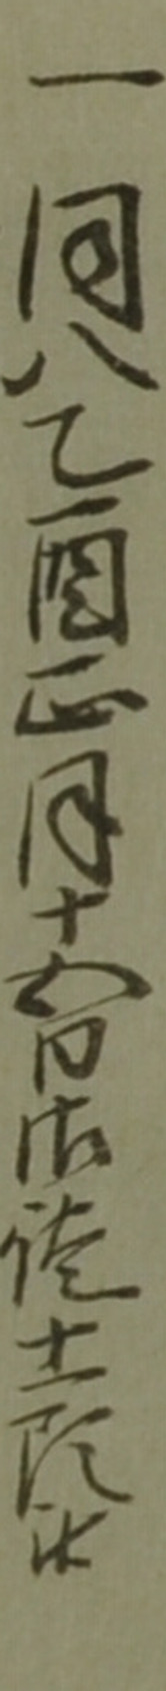一同八乙酉正月十五日御徒士頭被
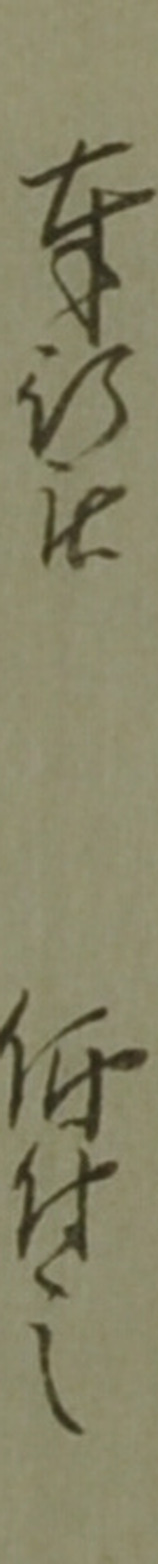奉行被仰付之
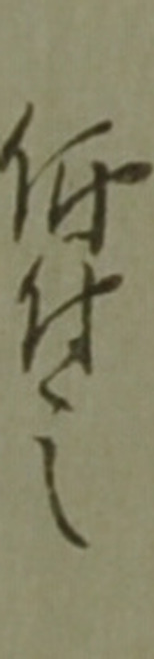仰付之
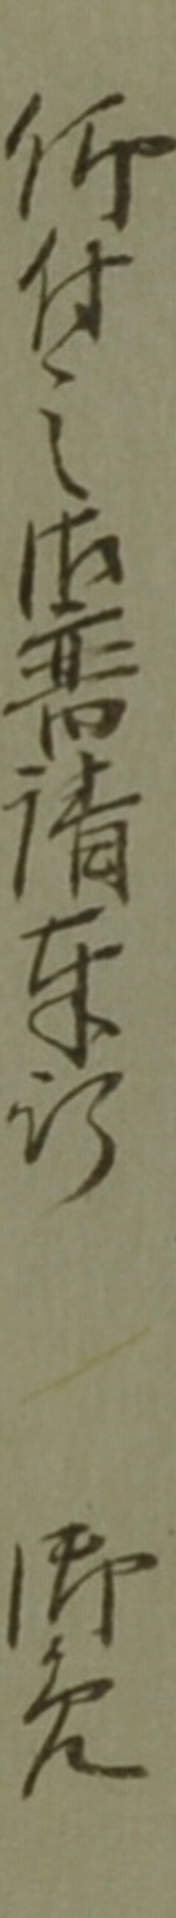仰付之御普請奉行御免
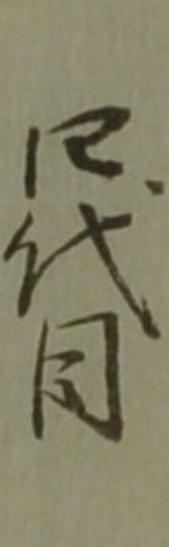四代目
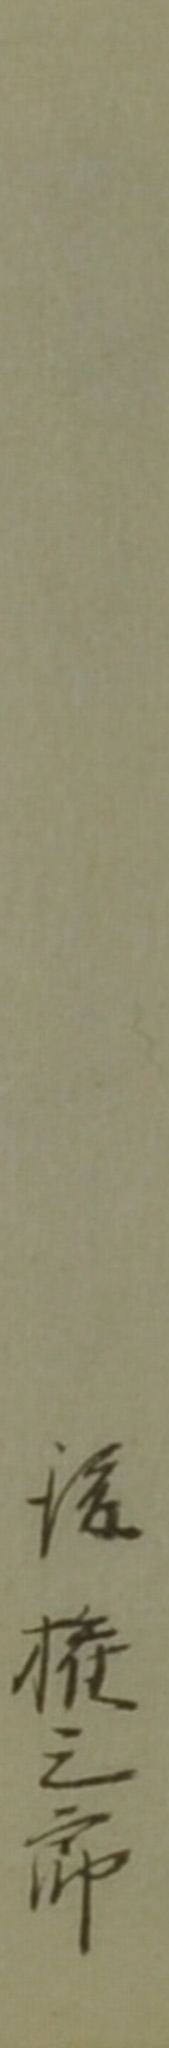後権三郎
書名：諸御役代々録（六）
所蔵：伊那市立高遠町図書館・合同会社AMANE
